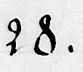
23.
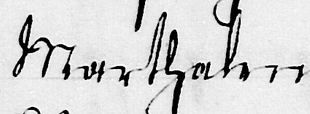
Marthalen
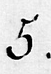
5.
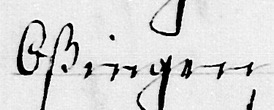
Oßingen
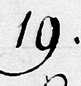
19.
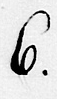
6.
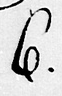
6.
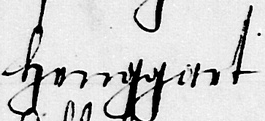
Henggart
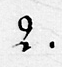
2.
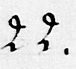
22.
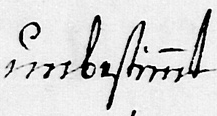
unbestimmt
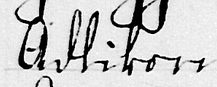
Adlikon
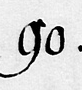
90.
